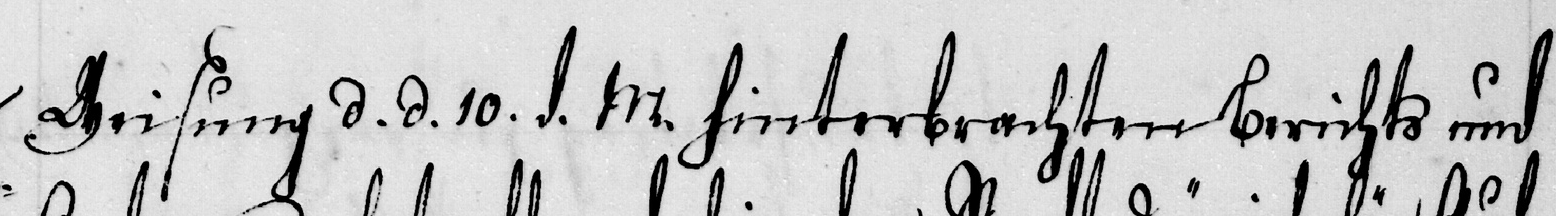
Weisung d. d. 10. d. M. hinterbrachten Berichts und
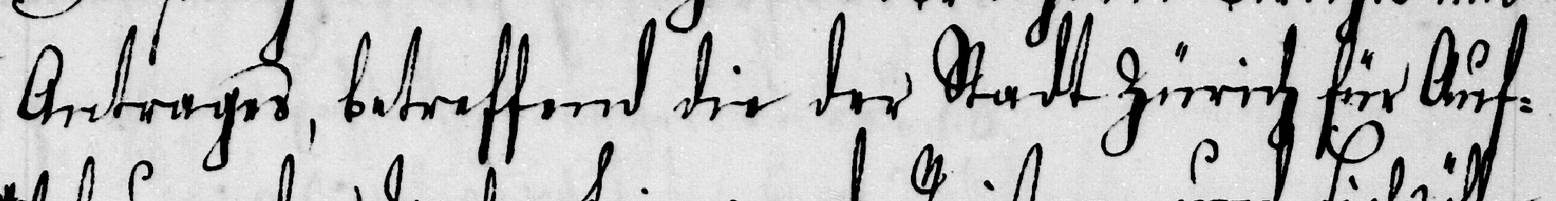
Antrages, betreffend die der Stadt Zürich für Aufh¬
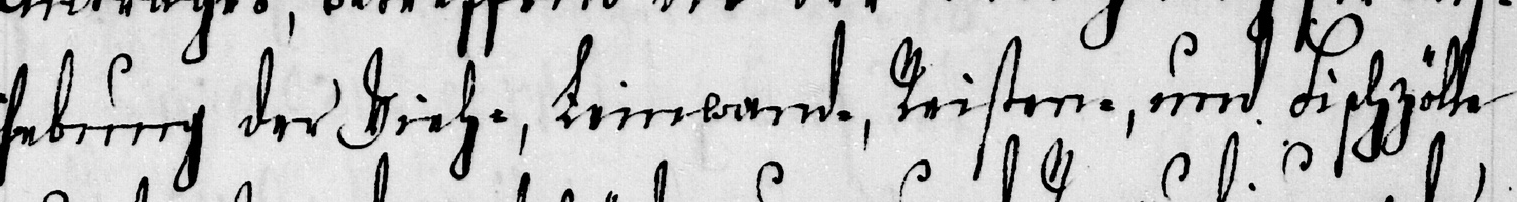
ebung der Vieh-, Leinwand-, Reisten-, und Fischzölle
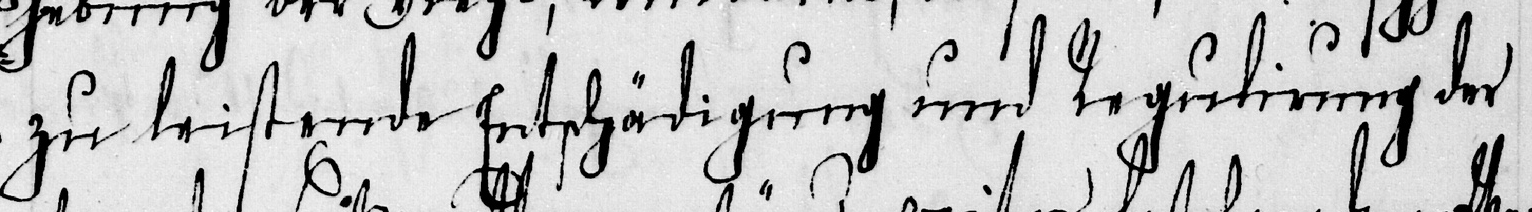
zu leistende Entschädigung und Regulirung der
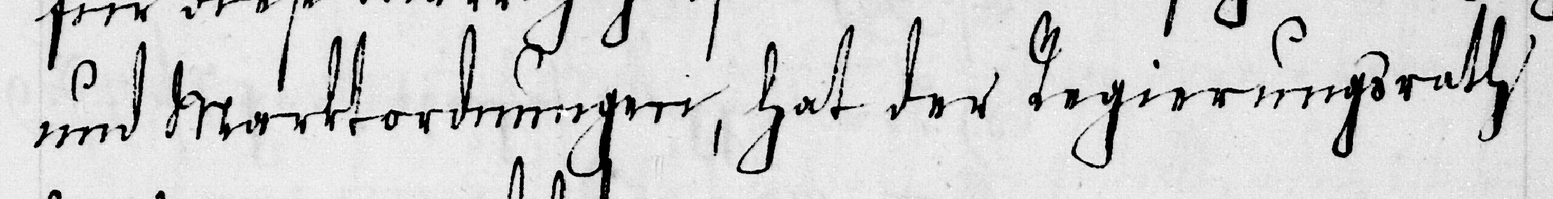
und Marktordnungen, hat der Regierungsrath
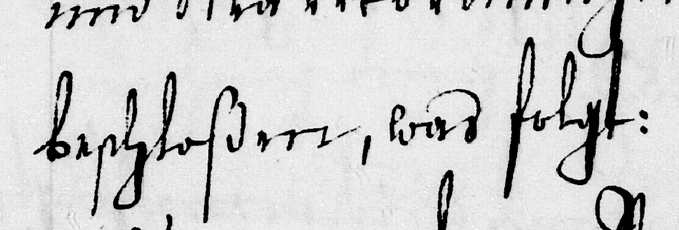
beschloßen, was folgt:
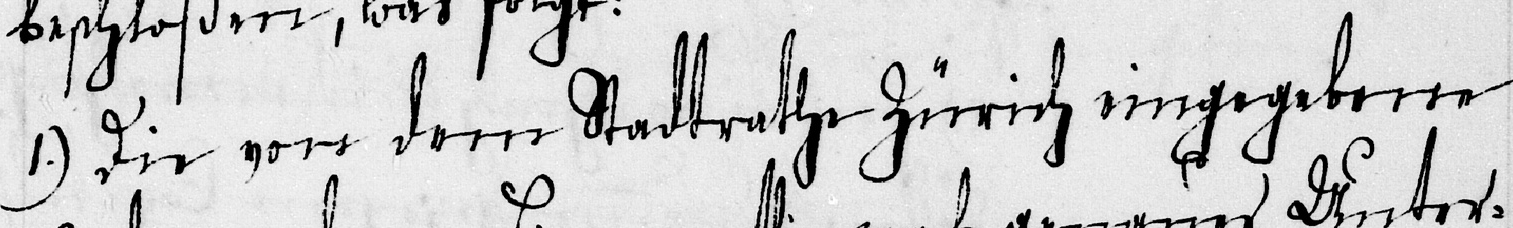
1.) Die von dem Stadtrathe Zürich eingegebene
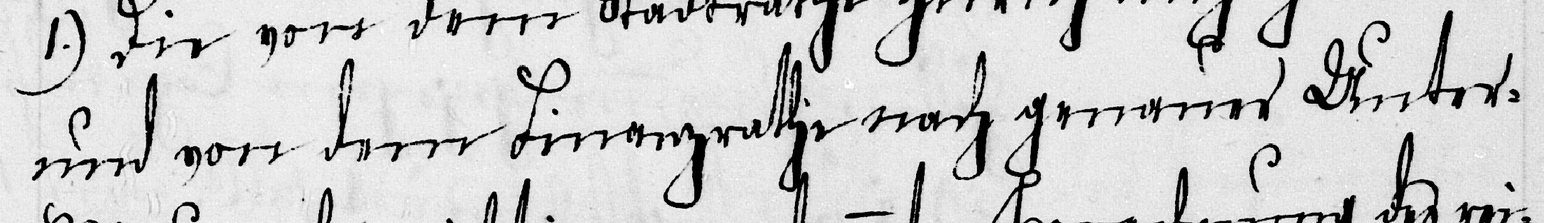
und von dem Finanzrathe nach genauer Unter¬
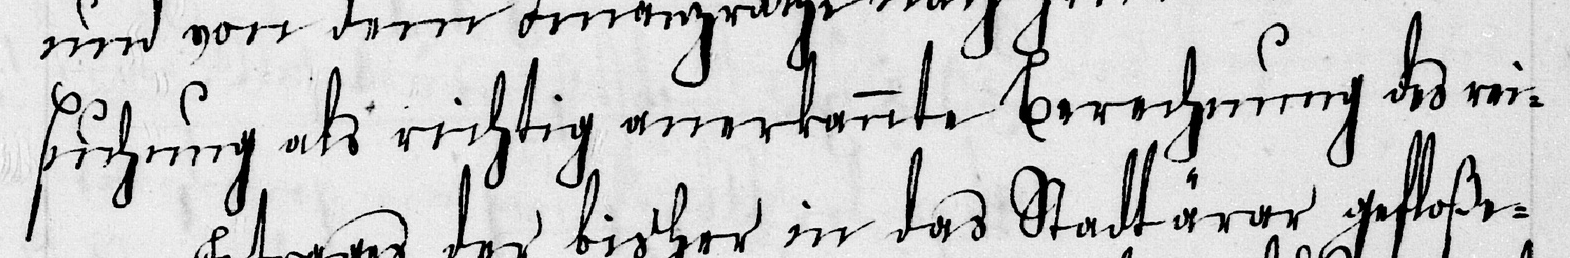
suchung als richtig anerkannte Berechnung des rei¬
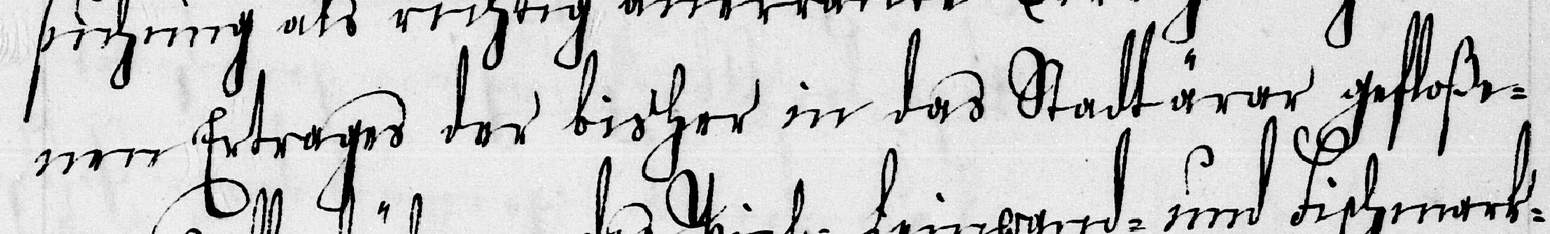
nen Ertrages der bisher in das Stadtärar gefloße¬
